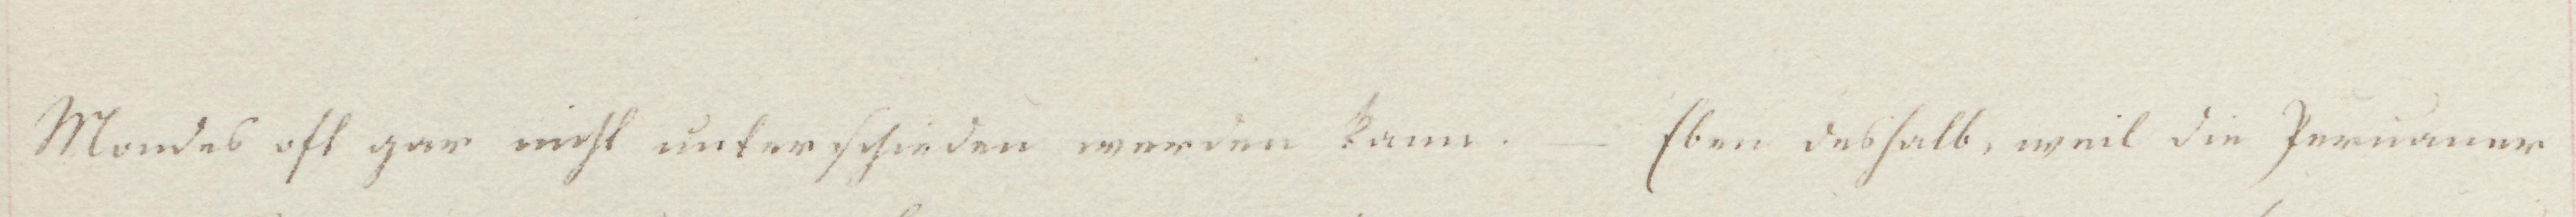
Mondes oft gar nicht unterschieden werden kann. – Eben deshalb, weil die Peruaner
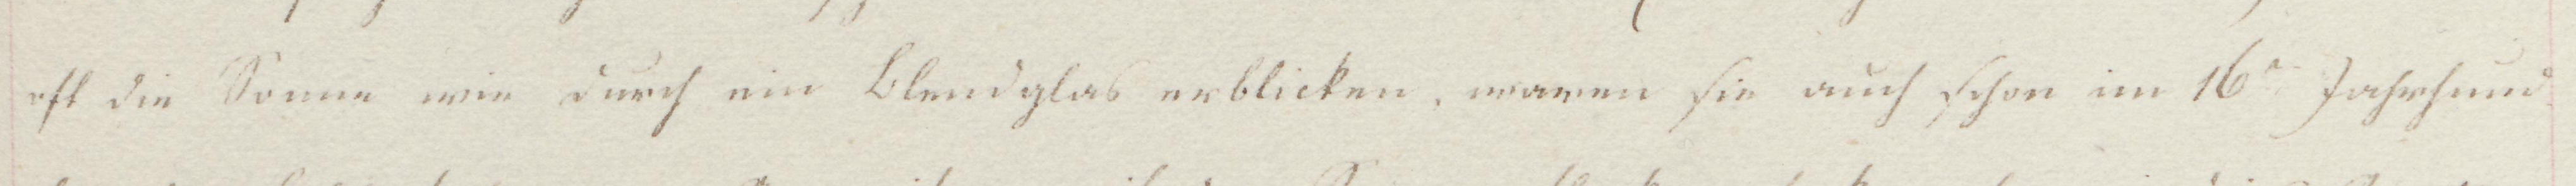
oft die Sonne wie durch ein Blendglas erblicken, waren sie auch schon im 16t￼ Jahrhund.
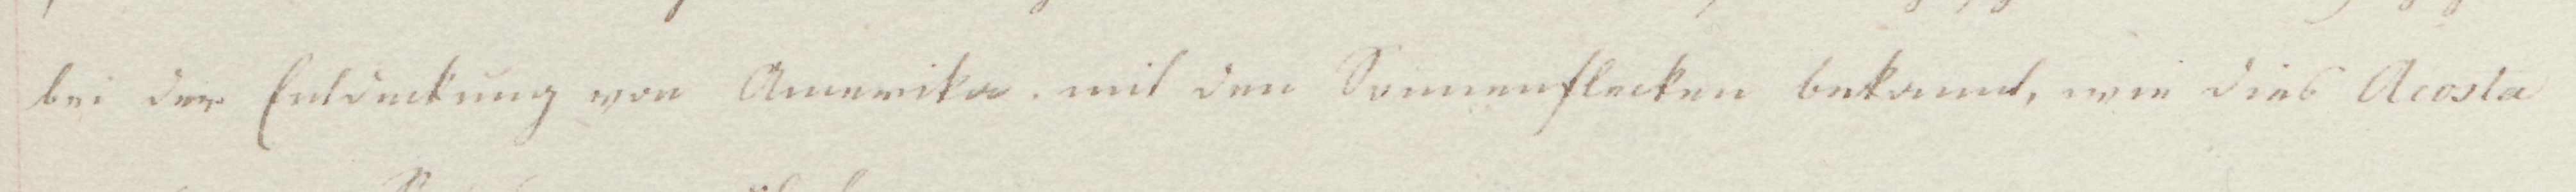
bei der Entdeckung von Amerika, mit den Sonnenflecken bekannt, wie dies Acosta
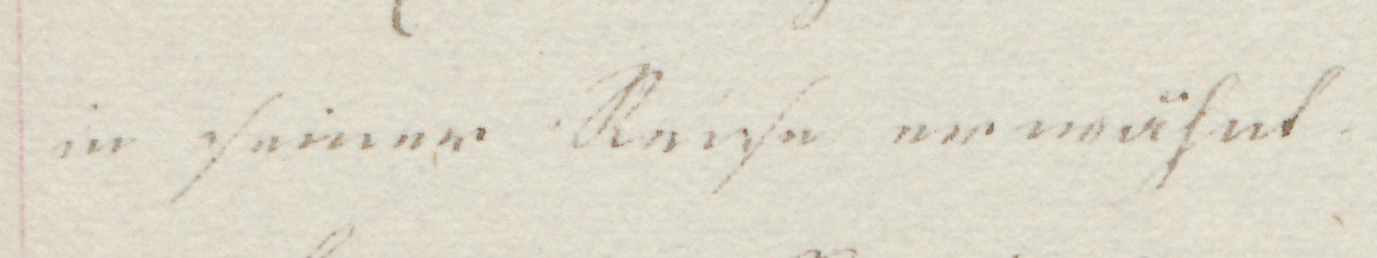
in seiner Reise erwähnt.
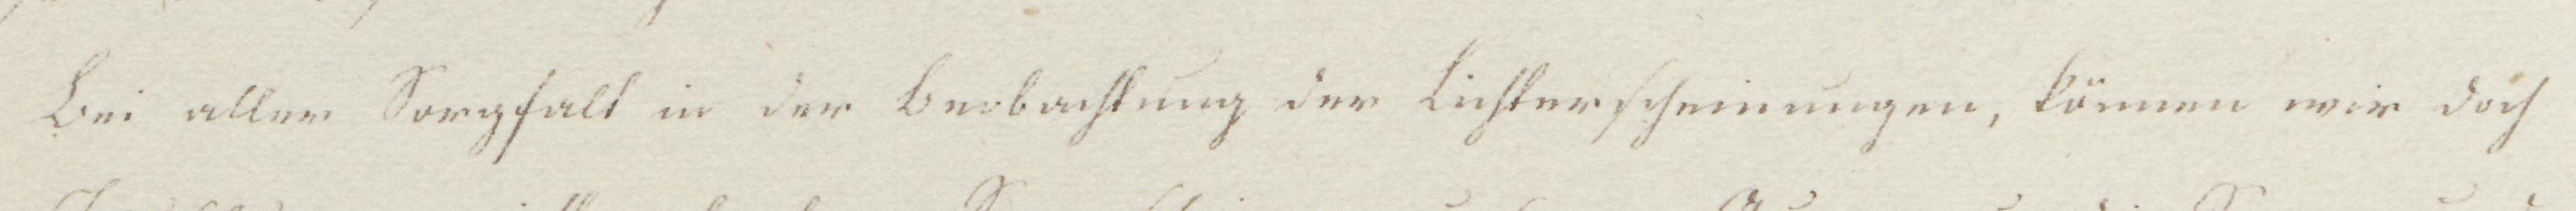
Bei aller Sorgfalt in der Beobachtung der Lichterscheinungen, können wir doch
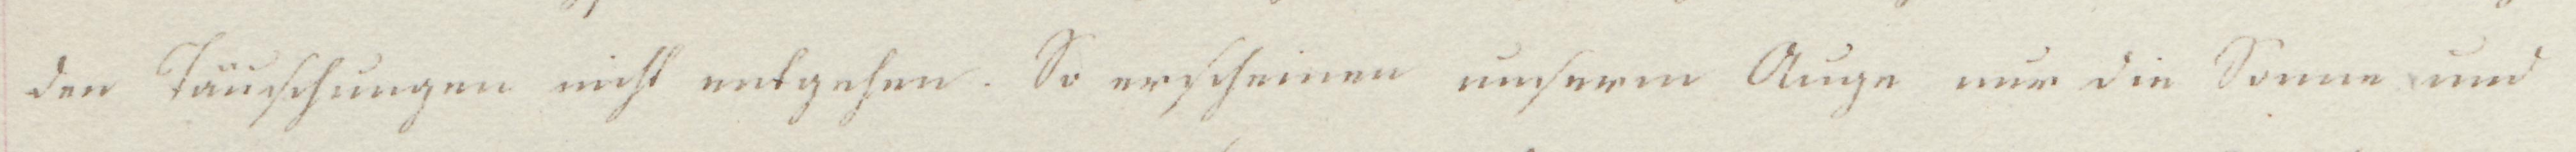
den Täuschungen nicht entgehen. So erscheinen unserm Auge nur die Sonne und
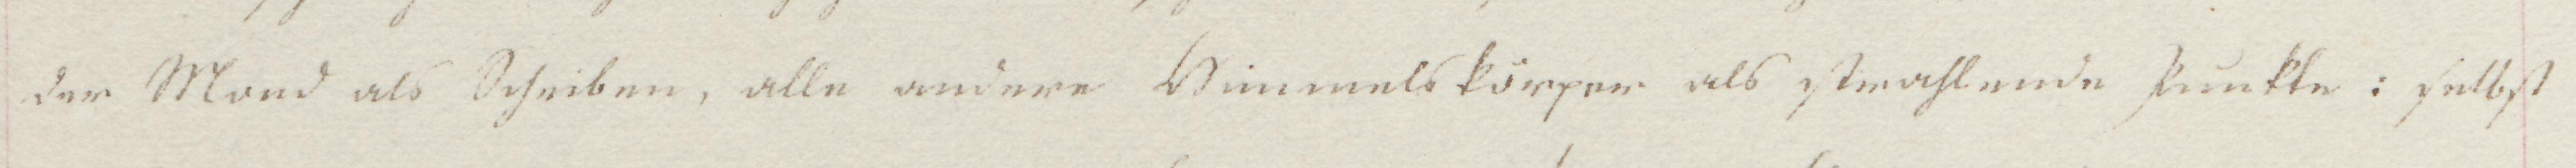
der Mond als Scheiben, alle andern Himmelskörper als strahlende Punkte: selbst
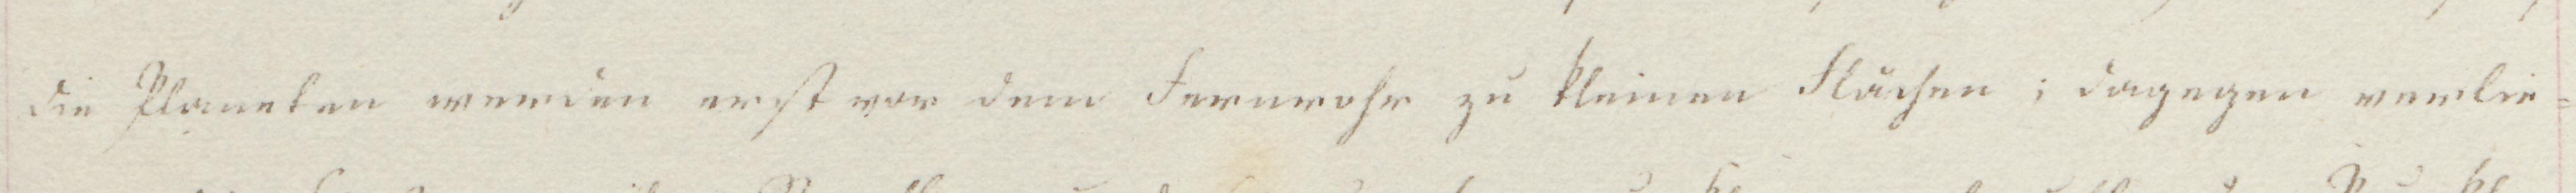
die Planeten werden erst vor dem Fernrohr zu kleinen Flächen; dagegen verlie-
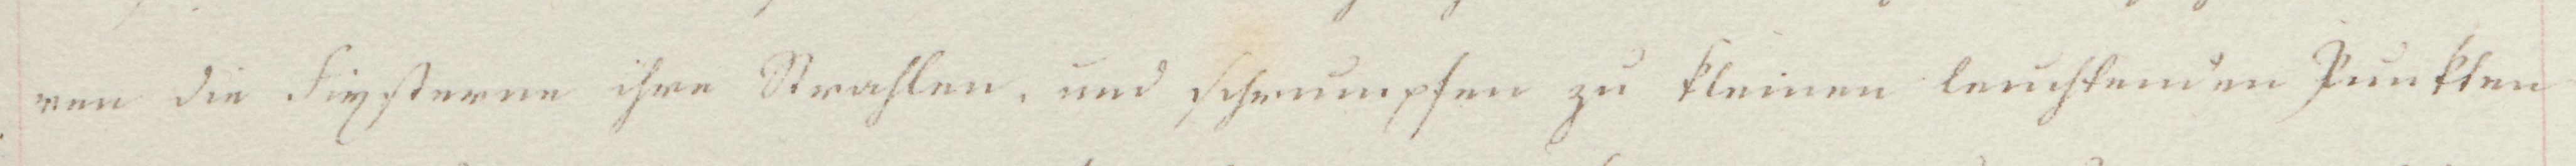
ren die Fixsterne ihre Strahlen, und schrumpfen zu kleinen leuchtenden Punkten
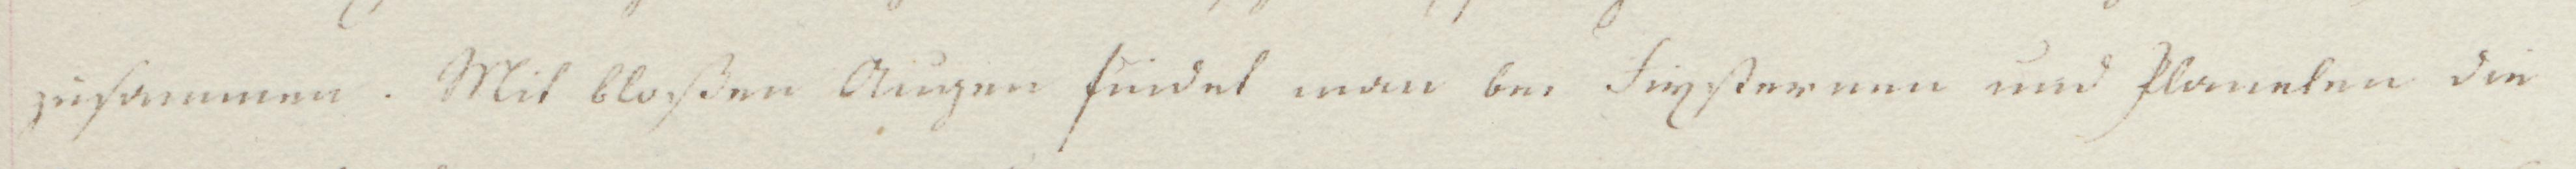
zusammen. Mit bloßen Augen findet man bei Fixsternen und Planeten die
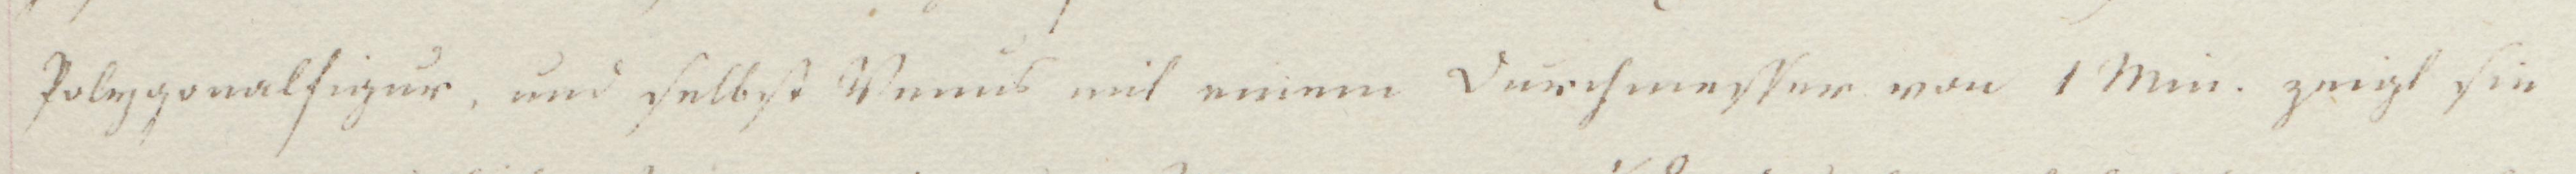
Polygonalfigur, und selbst Venus mit einem Durchmesser von 1 Min. zeigt sie
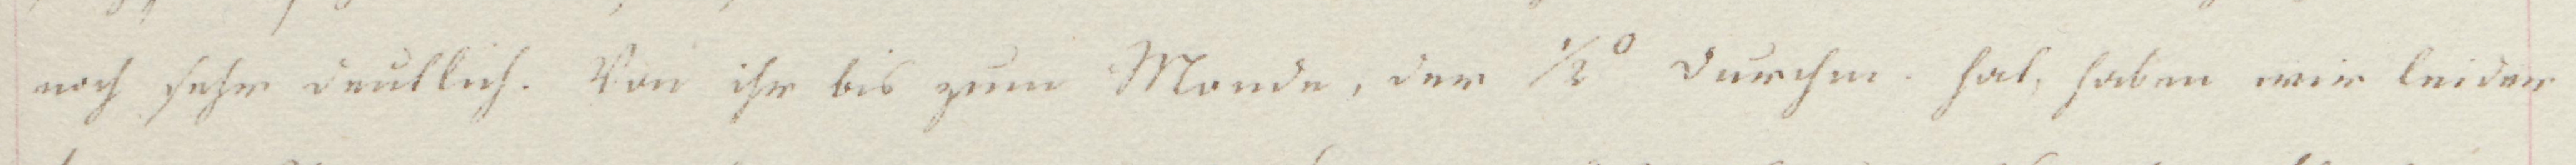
noch sehr deutlich. Von ihr bis zum Monde, der ½° Durchm. hat, haben wir leider
